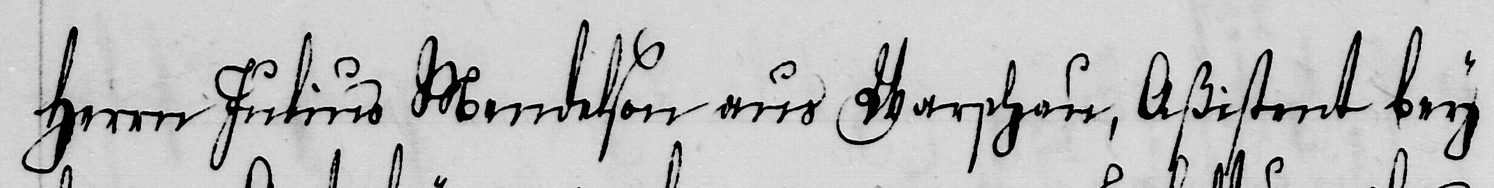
Herrn Julius Mendelson aus Warschau, Aßistent bey
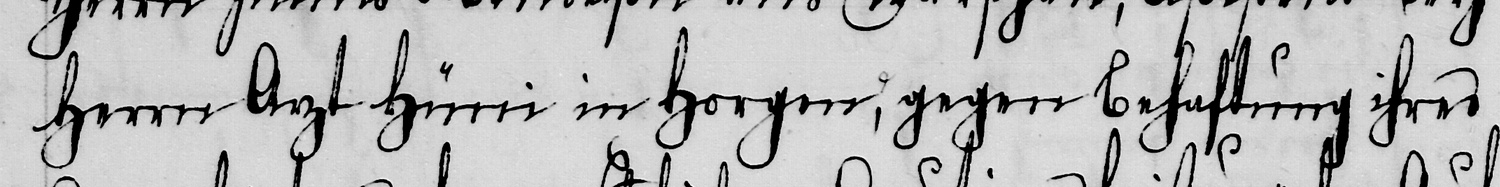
Herrn Arzt Hüni in Horgen, gegen Behaftung ihres
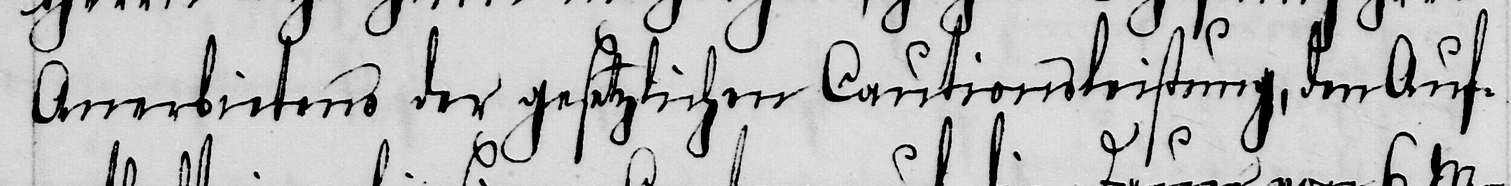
Anerbietens der gesetzlichen Cautionsleistung, den Auf¬
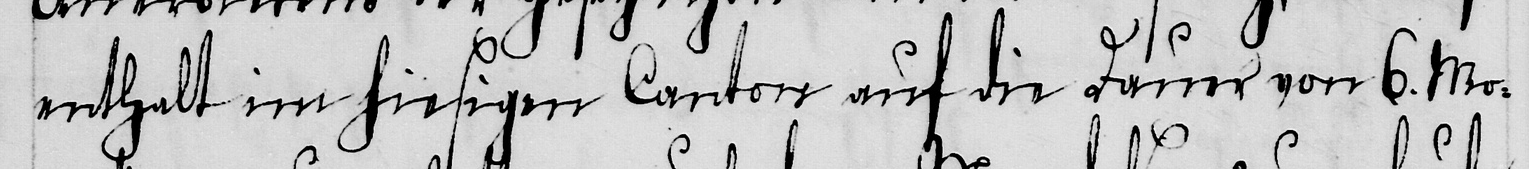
enthalt in hiesigen Canton auf die Dauer von 6. Mo¬
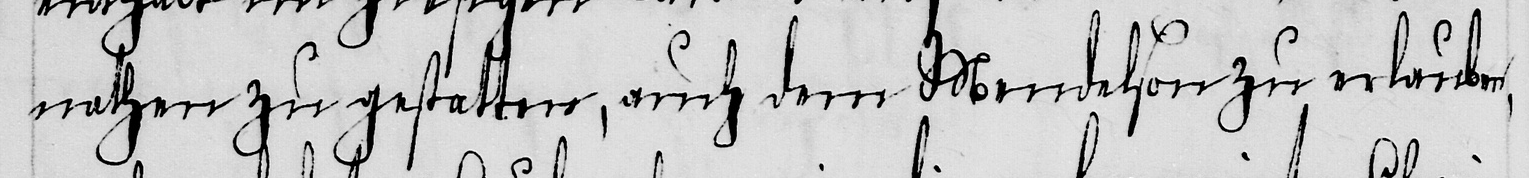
nathen zu gestatten, auch dem Mendelson zu erlauben,
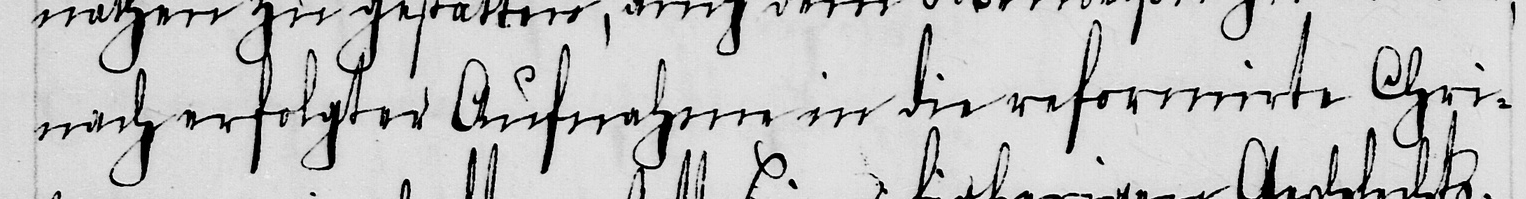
nach erfolgter Aufnahme in die reformirte Chri¬
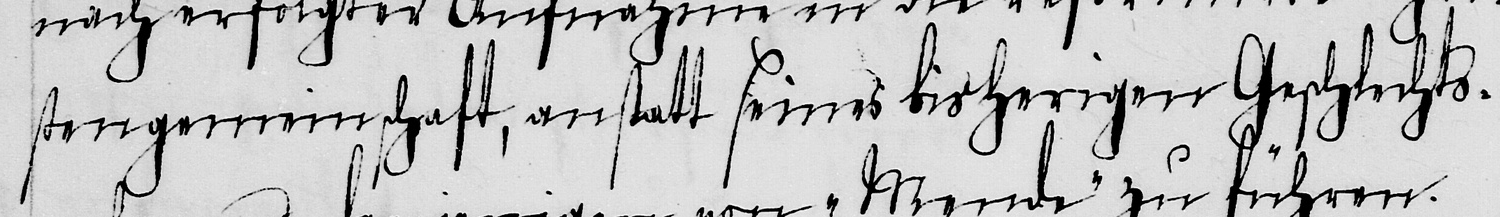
stengemeinschaft, anstatt seines bisherigen Geschlechts¬
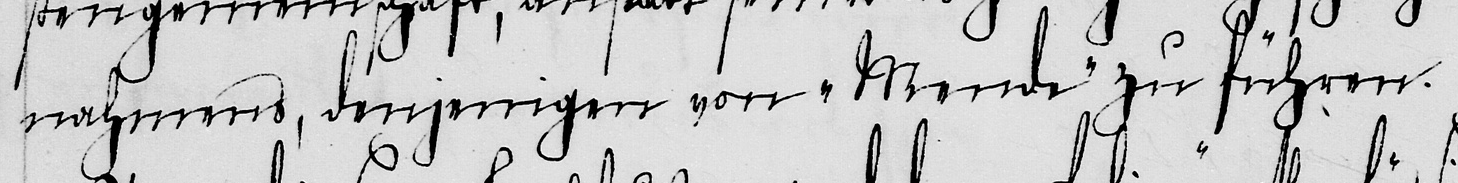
nahmens, denjenigen von „Mende“ zu führen.
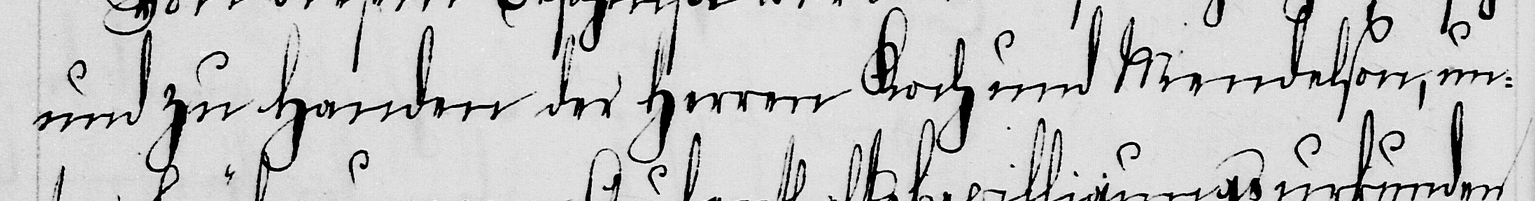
und zu Handen der Herren Koch und Mendelsohn, un¬
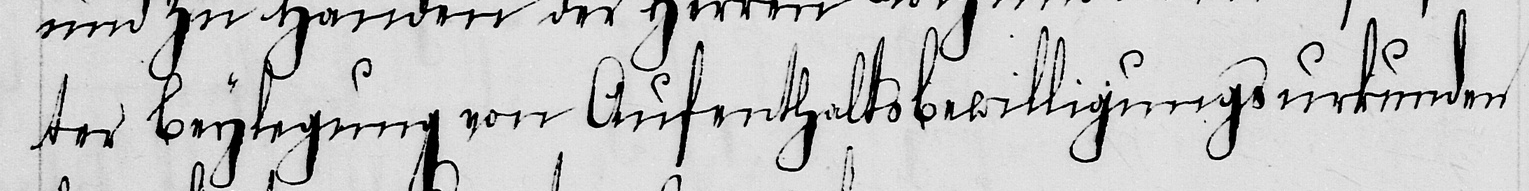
ter Beylegung von Aufenthaltsbewilligungsurkunden
